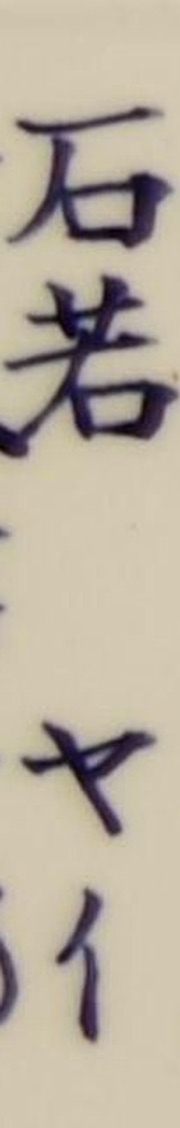石若ヤイ
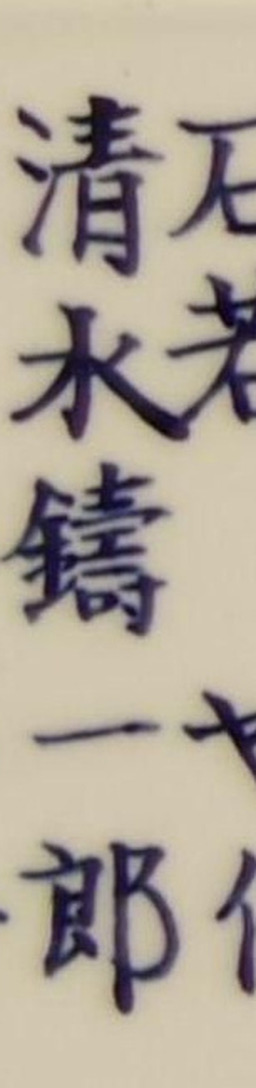清水鋳一郎
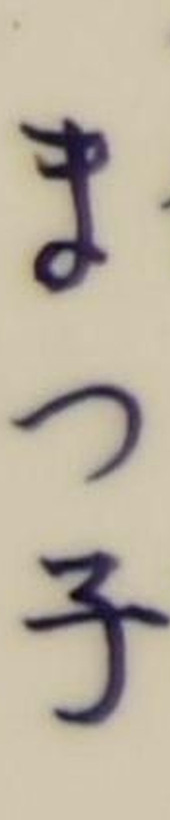まつ子
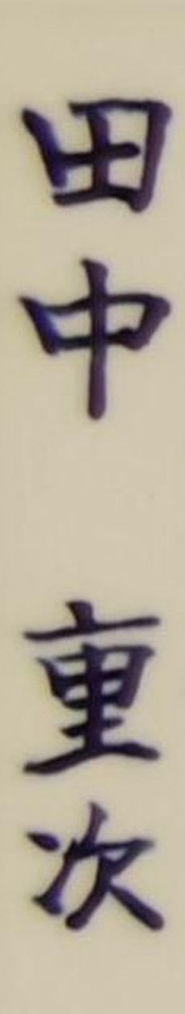田中重次

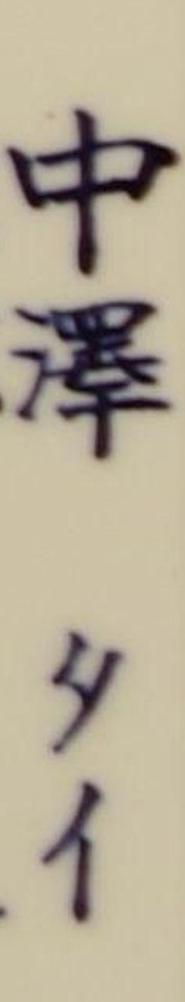中澤タイ
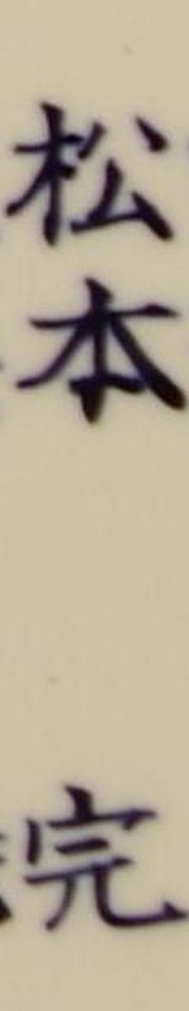松本完
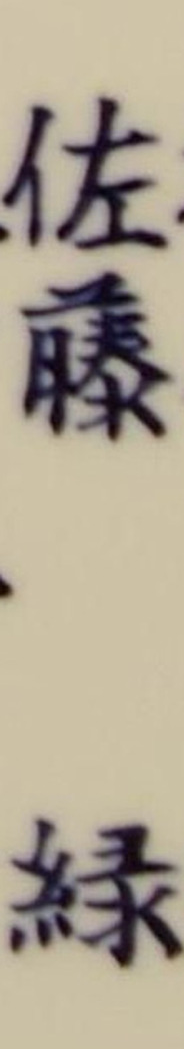佐藤緑
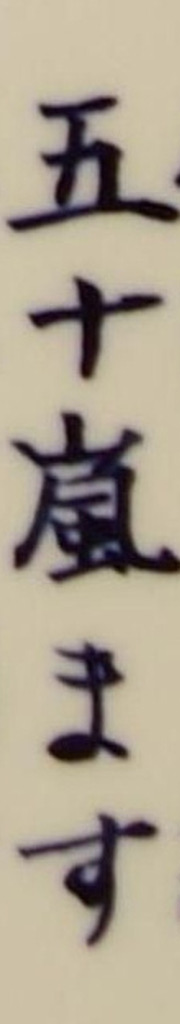五十嵐ます
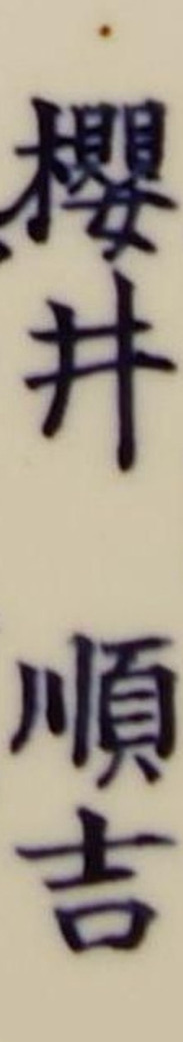桜井順吉
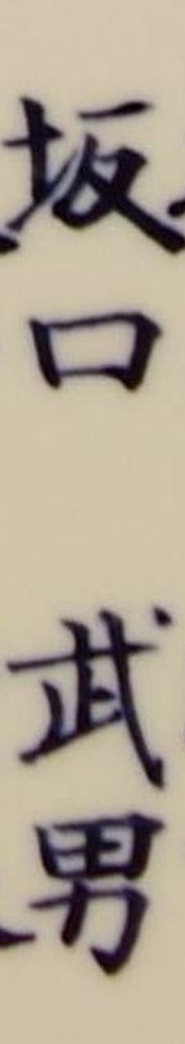坂口武男
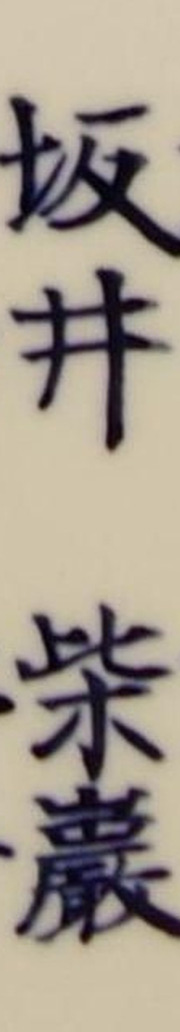坂井柴巌
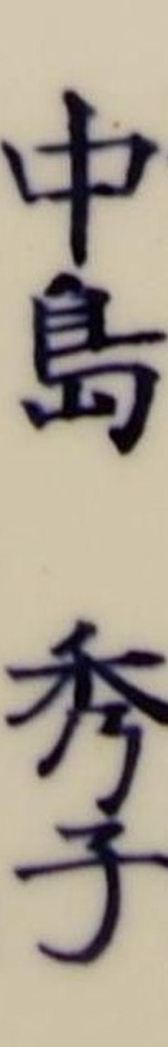中島秀子
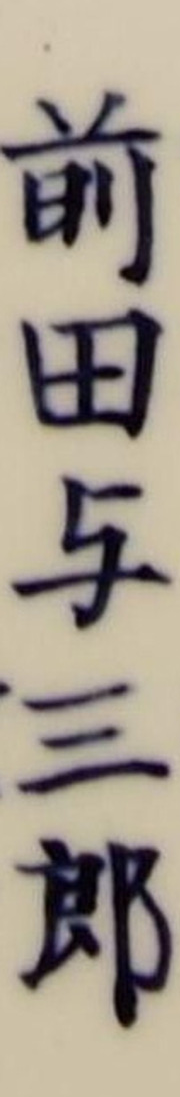前田与三郎
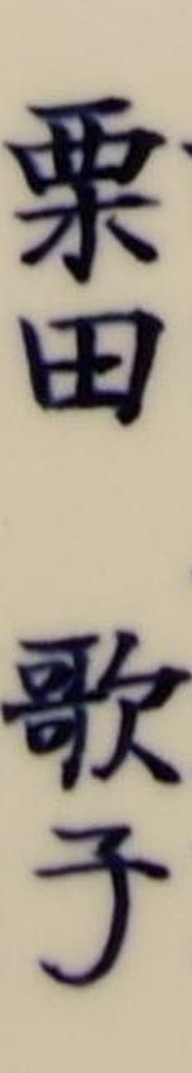栗田歌子
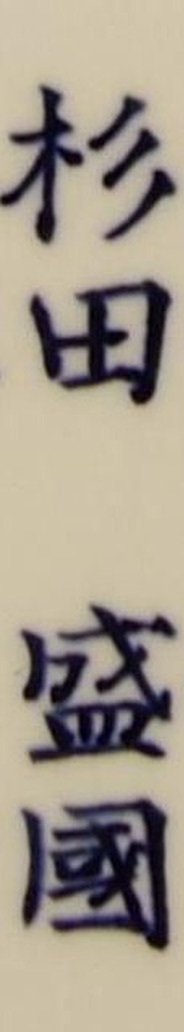杉田盛国
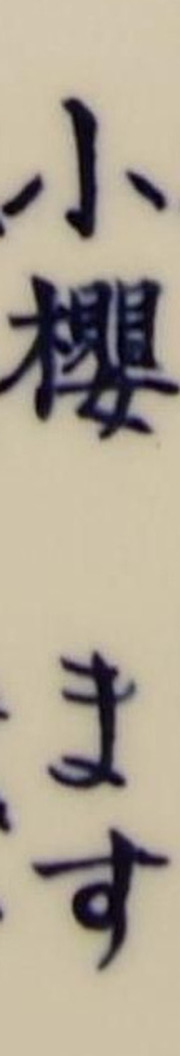小櫻ます
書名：A~D
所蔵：koyasan kongobuji
